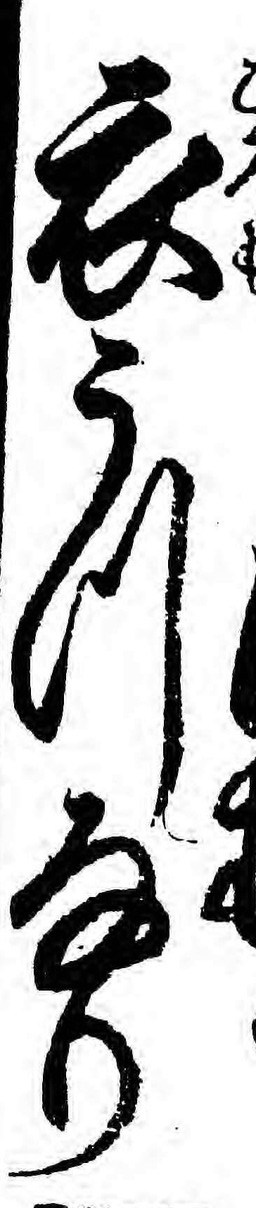衣うつなり
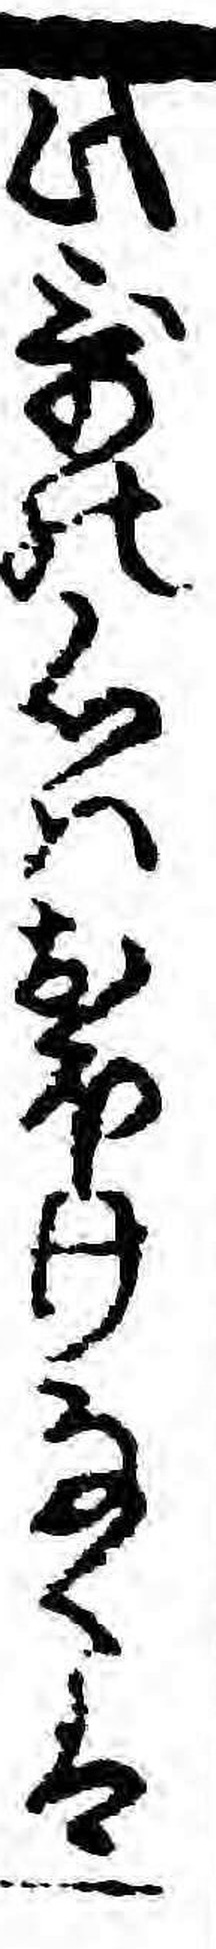此哥の心はおほけなくは
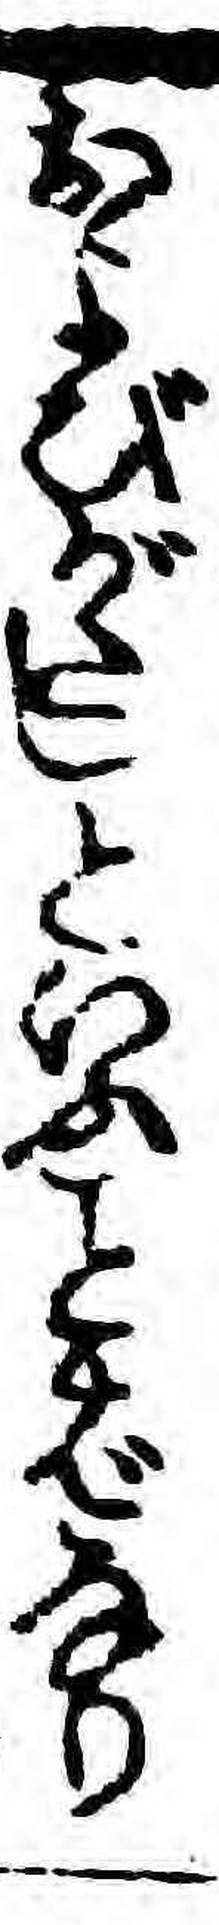およびがたしといふことばなり
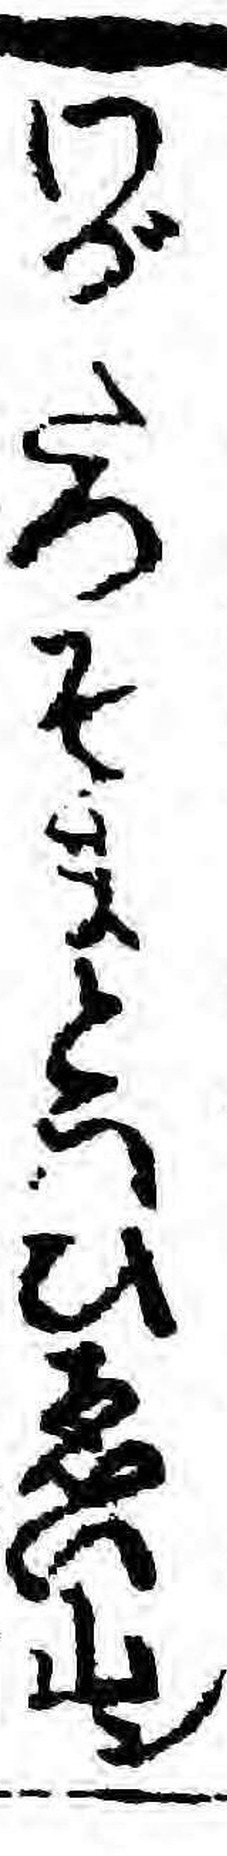わがたつそまとはひゑい山ン
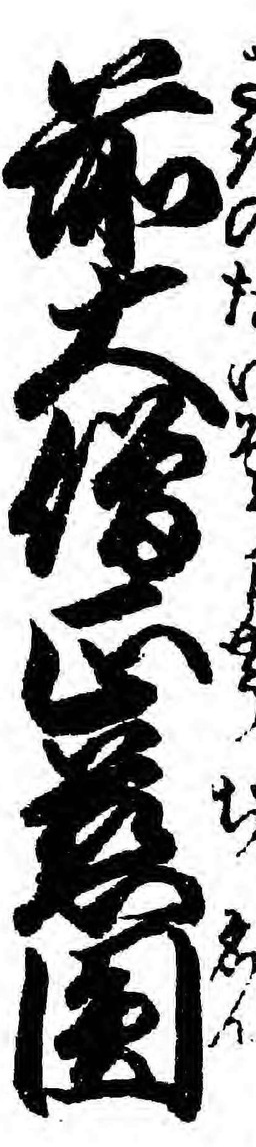前大僧正慈圓
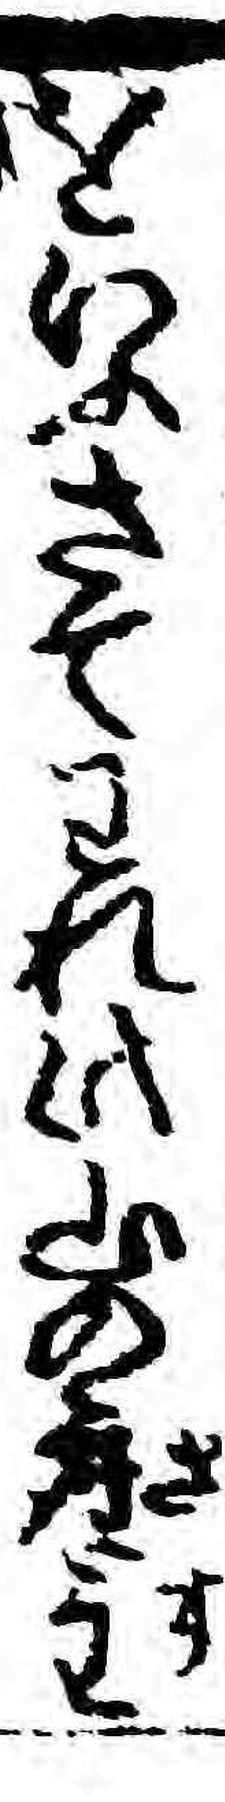をいふさてわれ此山の座主
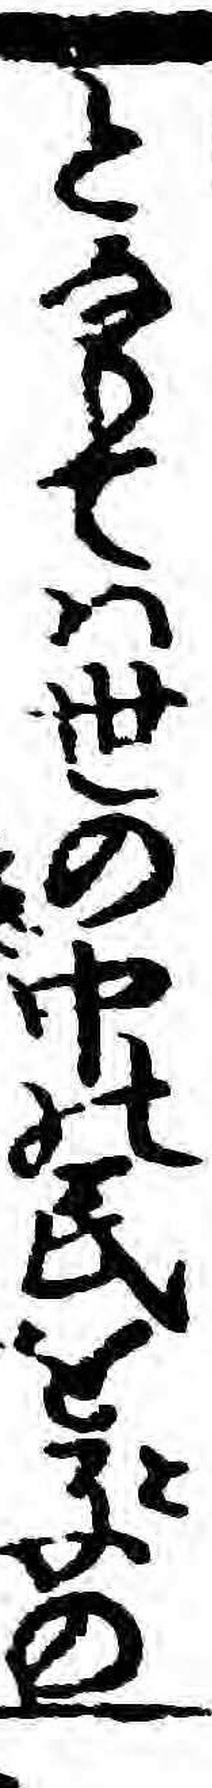となりては世の中の民を子の
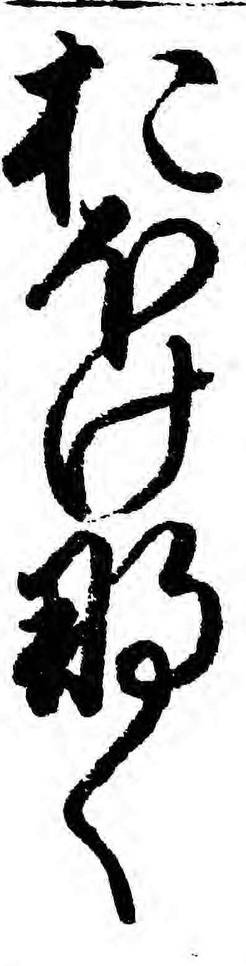おほけなく
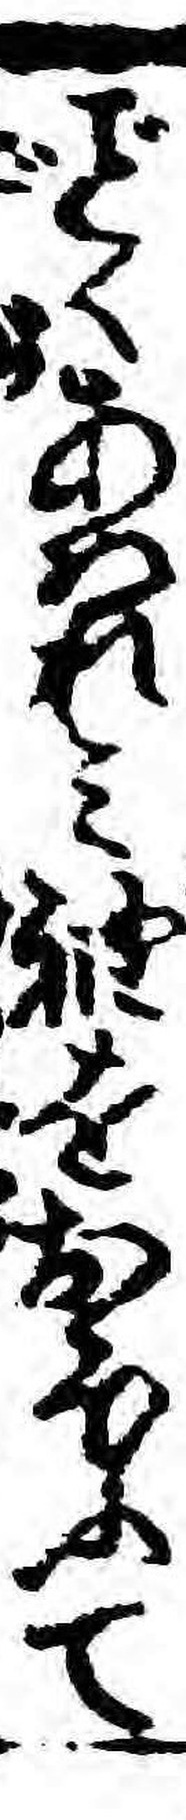ごとくあわれみ袖をおほふて
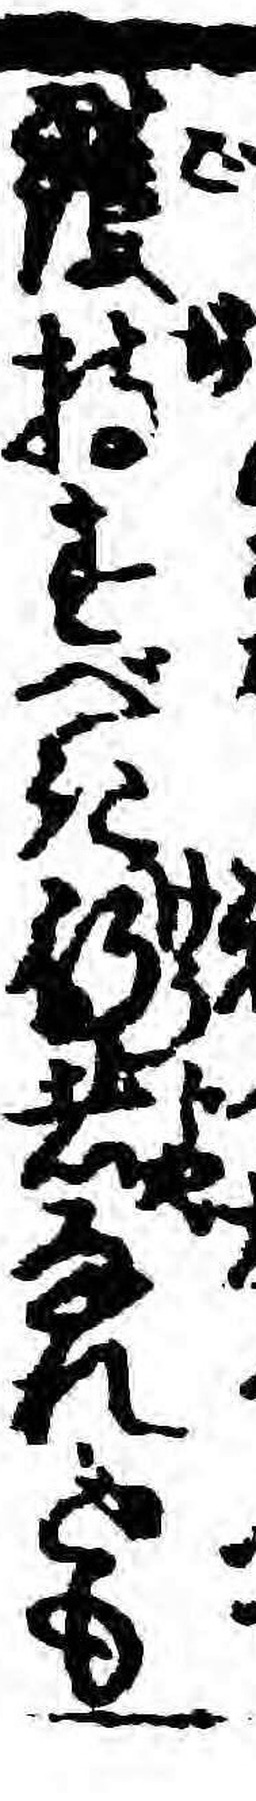護持すべき行者なれども
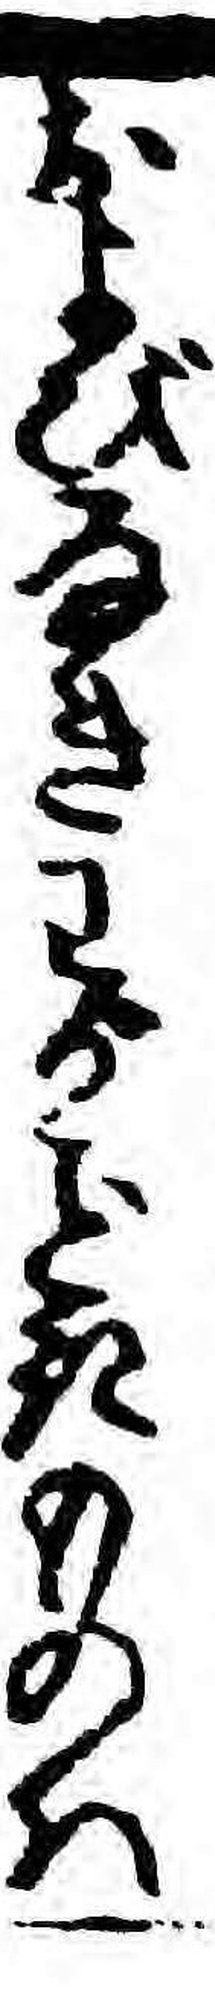およびなきわがごときものは
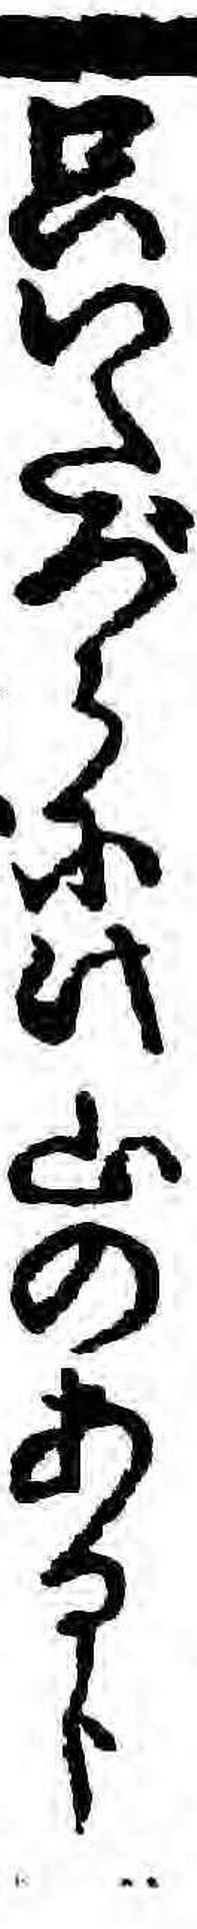只いたづらに此山のあるじ
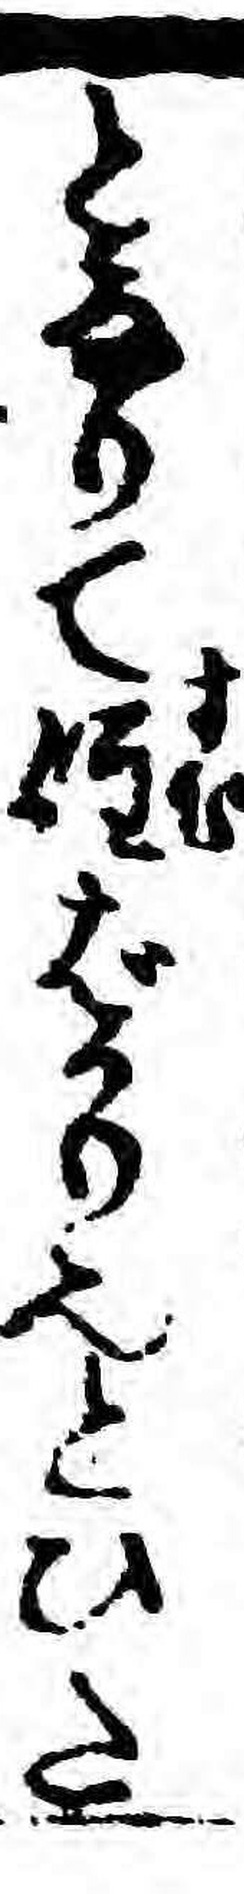となりて住ばかり也とひた
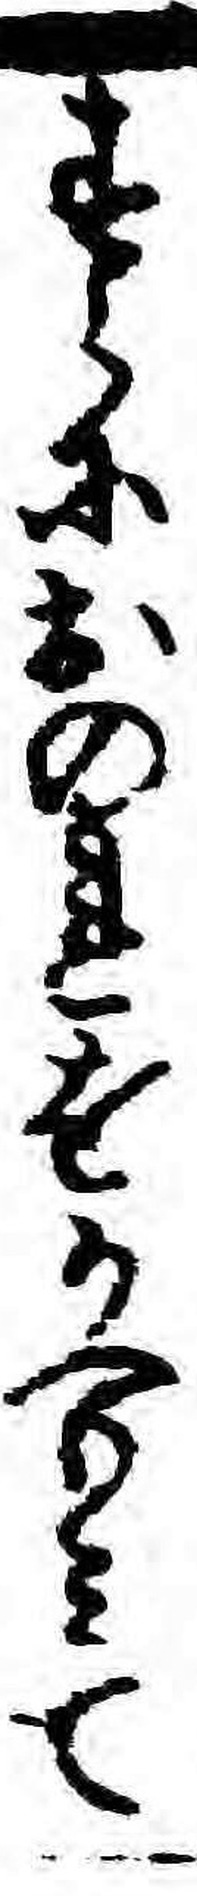すらにおのれをかへりみて
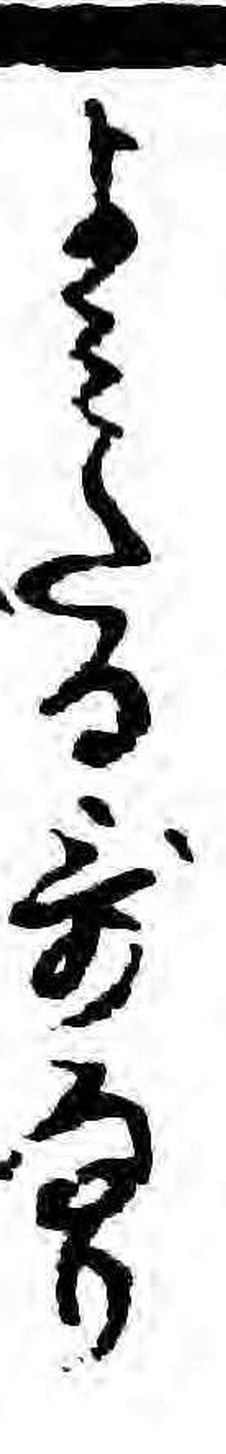よみたる哥なり
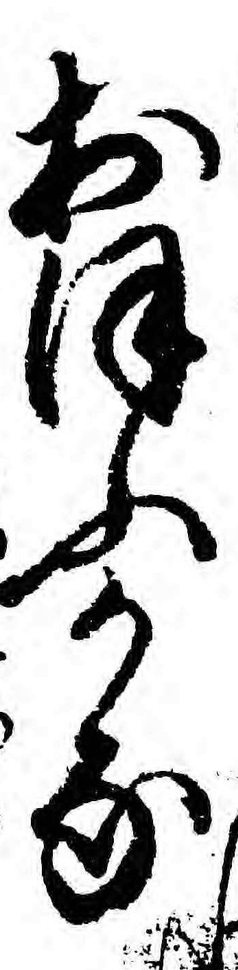おほふかな
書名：頭書和歌注譯／壽賀多百人一首小倉錦
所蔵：国文学研究資料館
